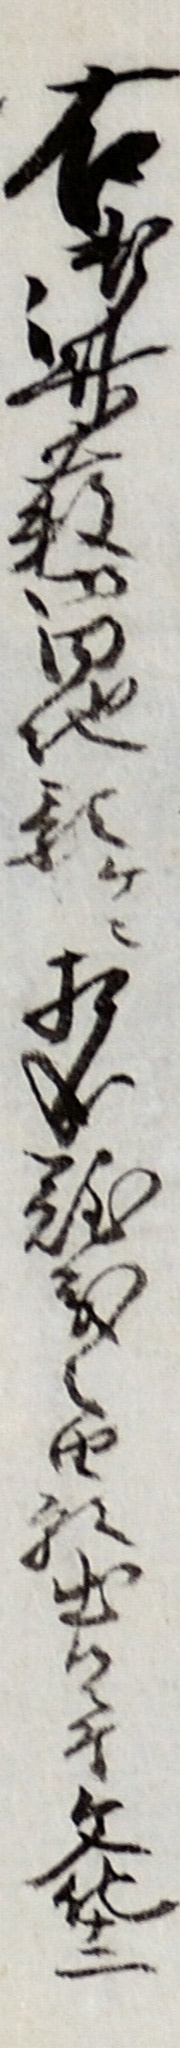右御竹藪御田地影ケニ相成難義之由願出候ニ付文化十二
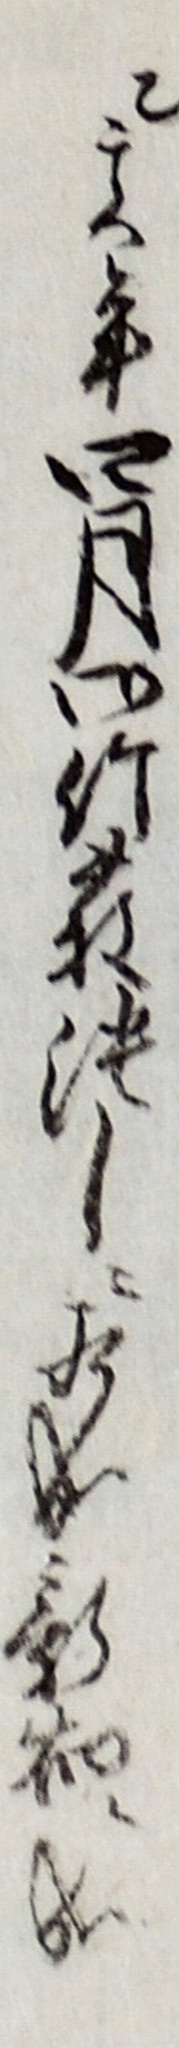乙亥年四月御竹藪潰しニ相成新畑ニ成
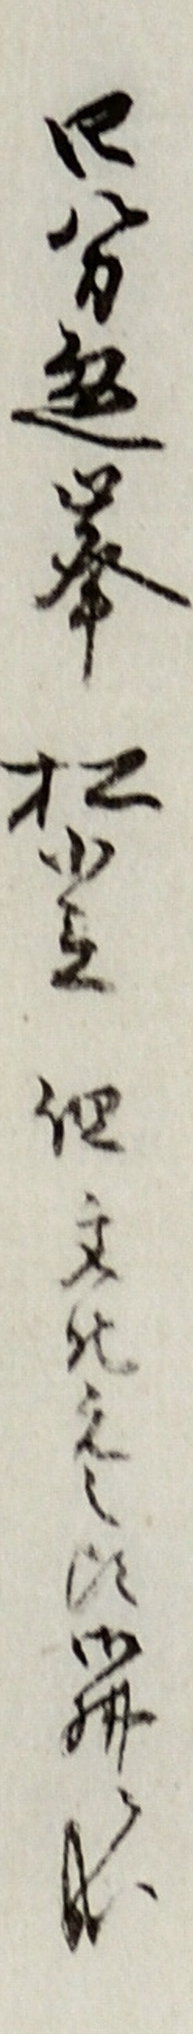四分辺峯松小立但文化元之頃御払ニ成

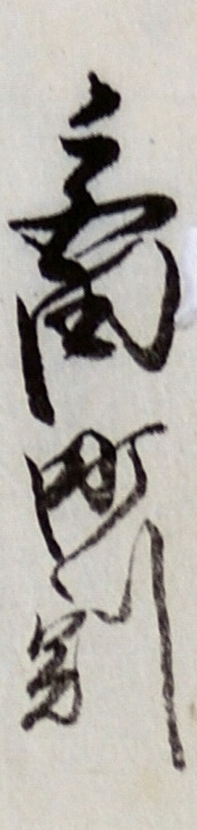宮田町割
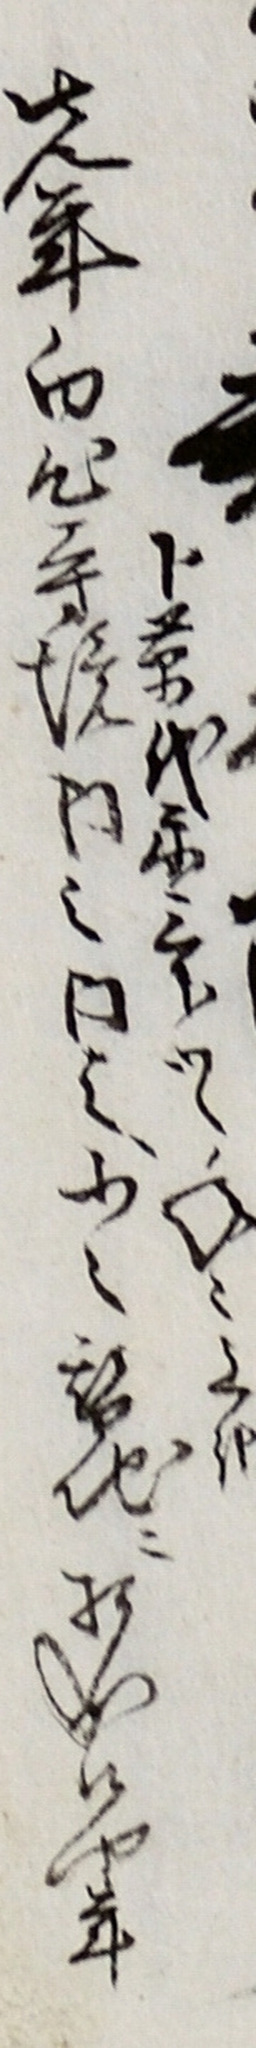先年白心寺境内之内は少々替地ニ相成候由年
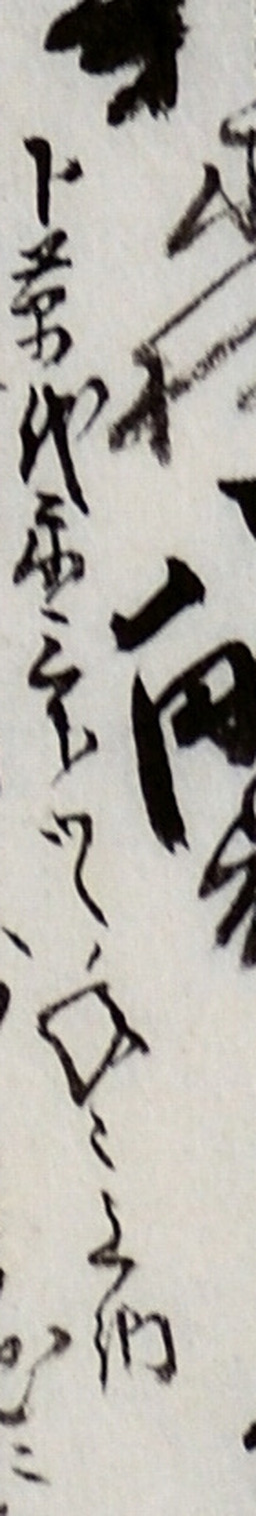下草代米三升ツヽ年々上納
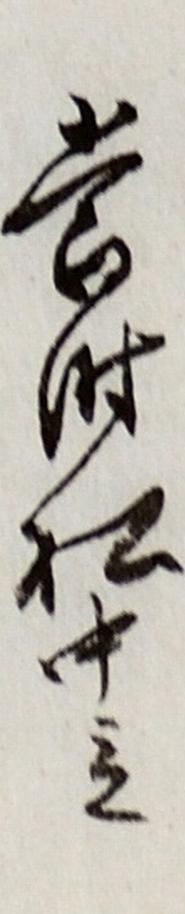当時松中立
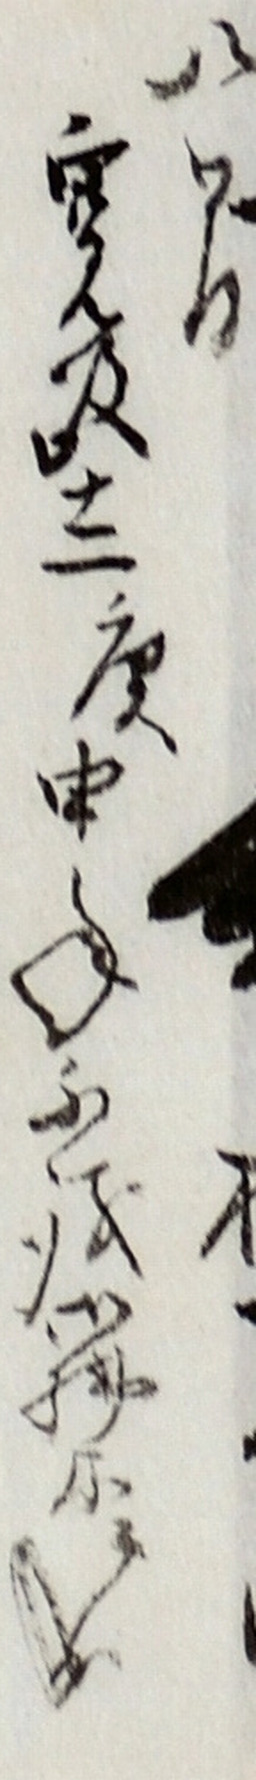寛政十二庚申年不残御払木ニ成
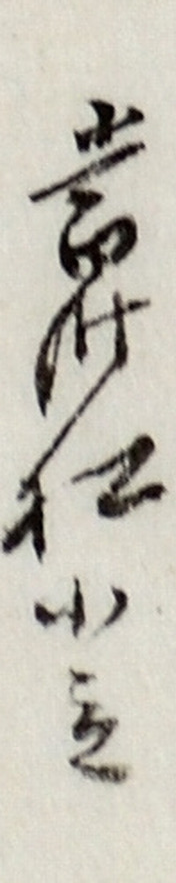当時松小立
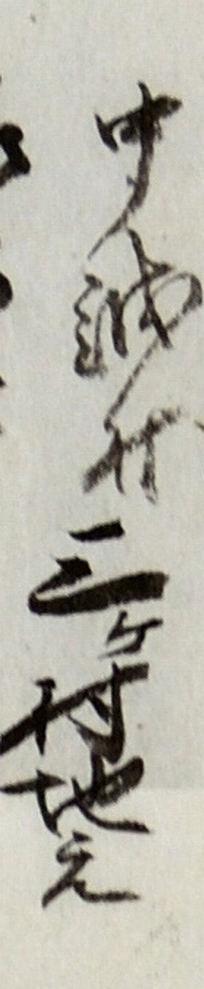中越村三ヶ村地元
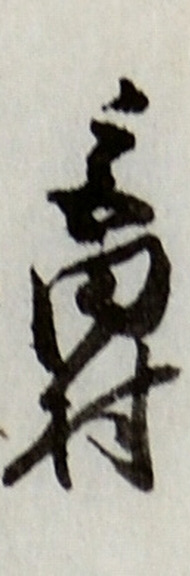宮田村
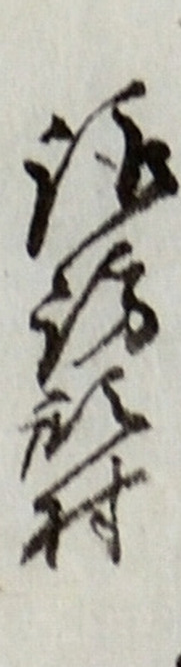諏訪形村
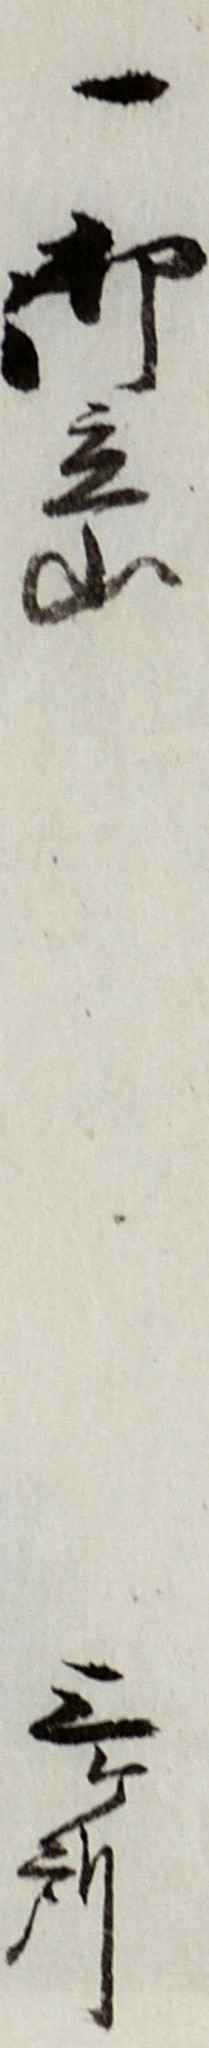一御立山三ヶ所
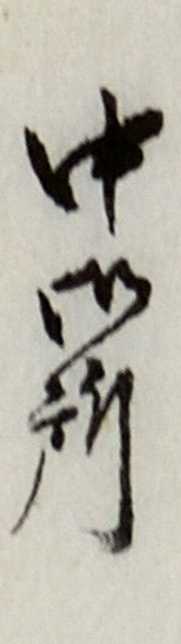中御所
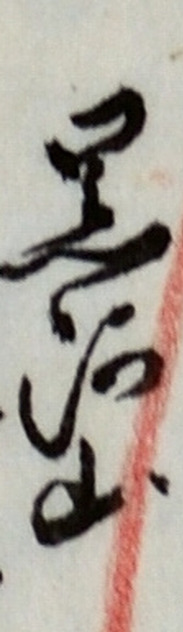黒河山

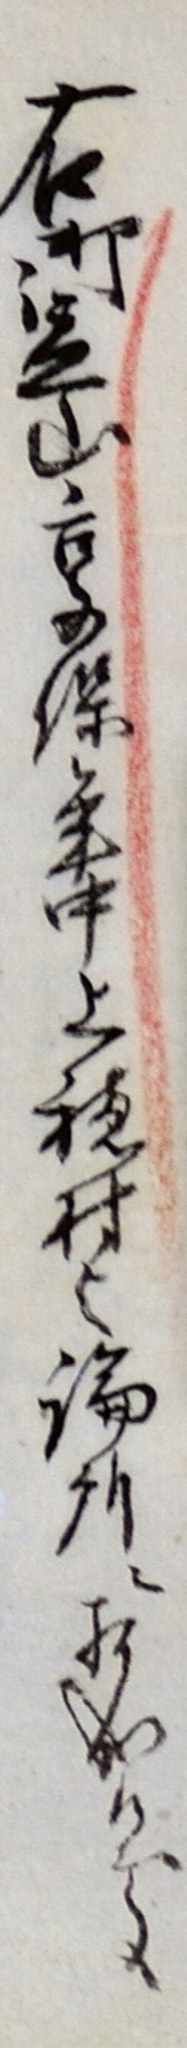右御立山享保年中上穂村与論所ニ相成候処
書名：郷中御林御竹薮名所附守之名前帳
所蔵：伊那市立高遠町図書館・合同会社AMANE
